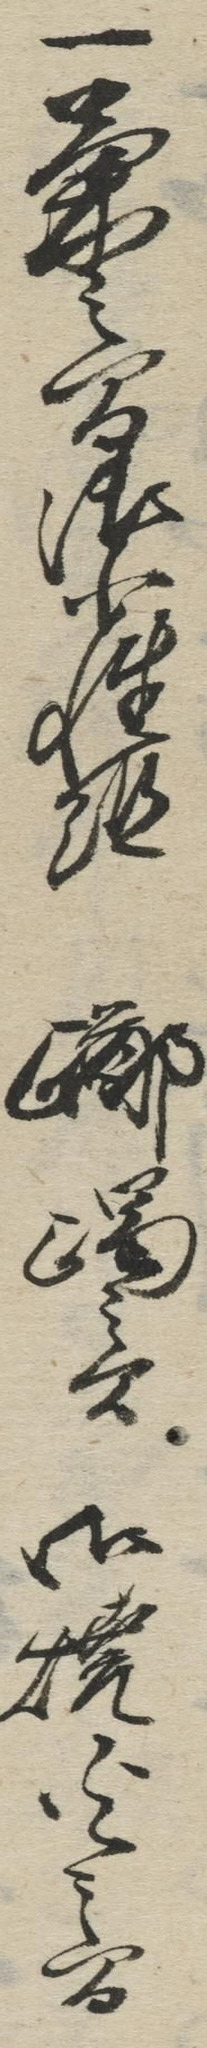一菊之間御小姓組躑躅之間御焼火之間
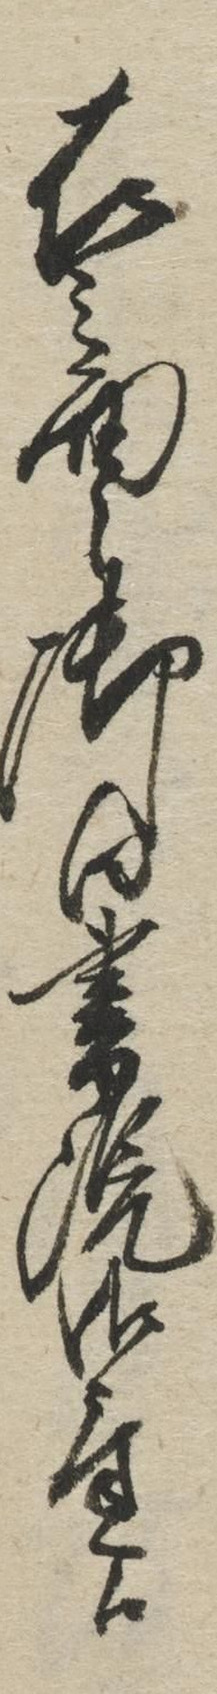右之面々御内書院御付江
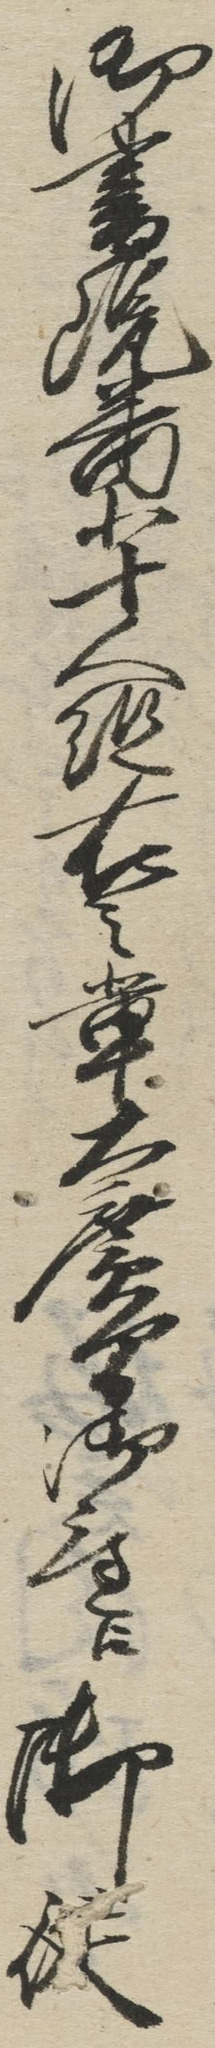御書院番等十人組右之輩大広間御付江御従
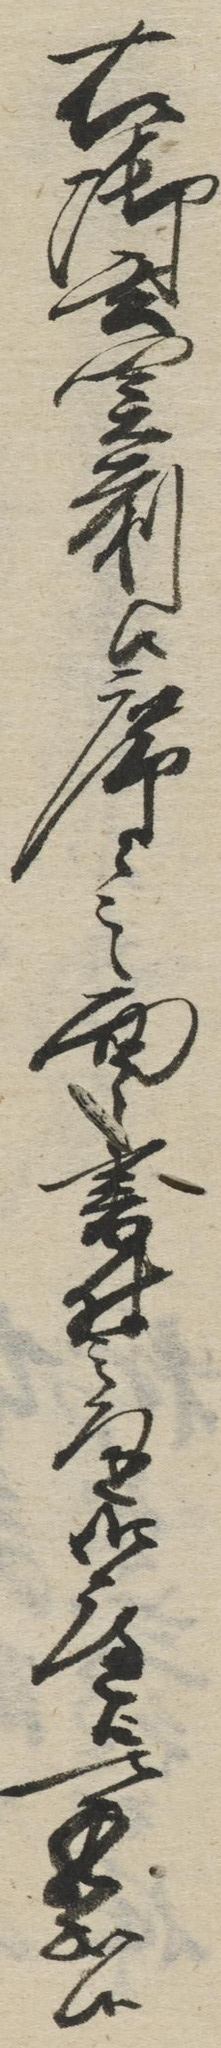右御玄関前江席々之面々書付之通御付江可罷出候
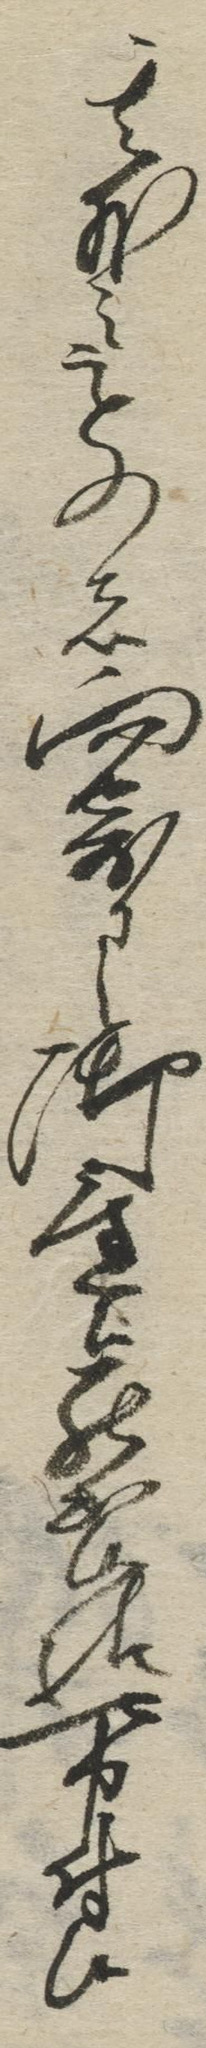其外之ものは向寄二て御付可罷出候様可申付候
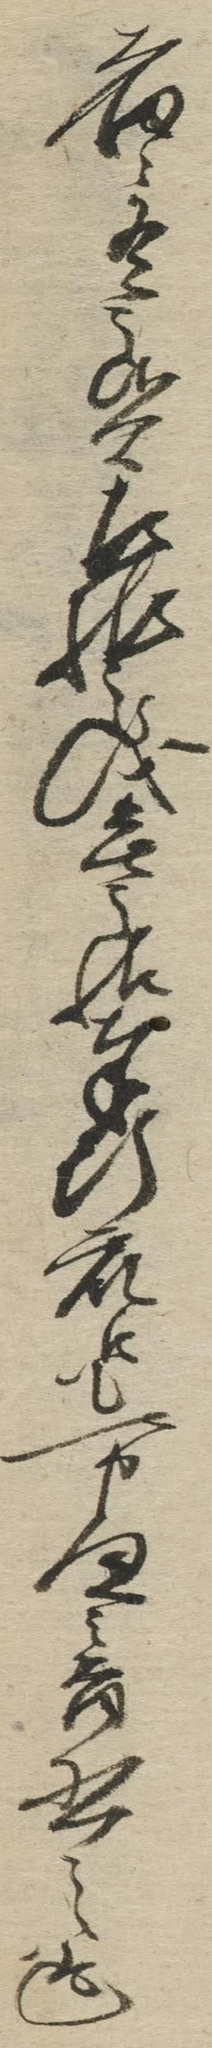者二有之候間左様之儀無之様奉行衆江も可申通之旨書之趣

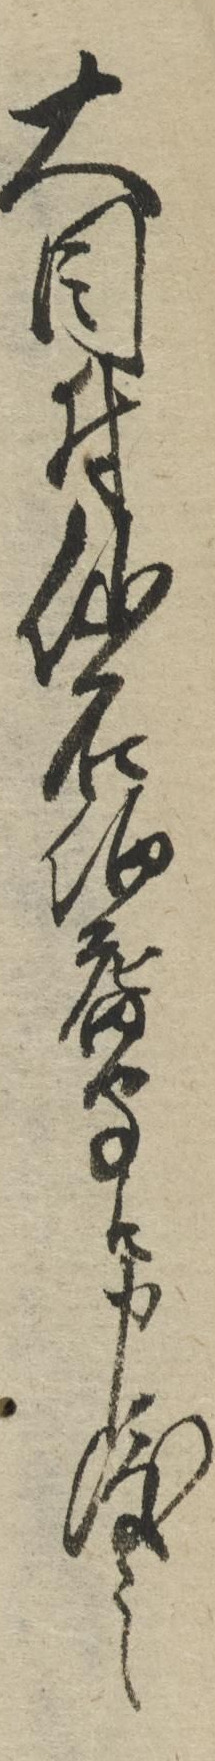大目付仙石伯耆守江申渡之
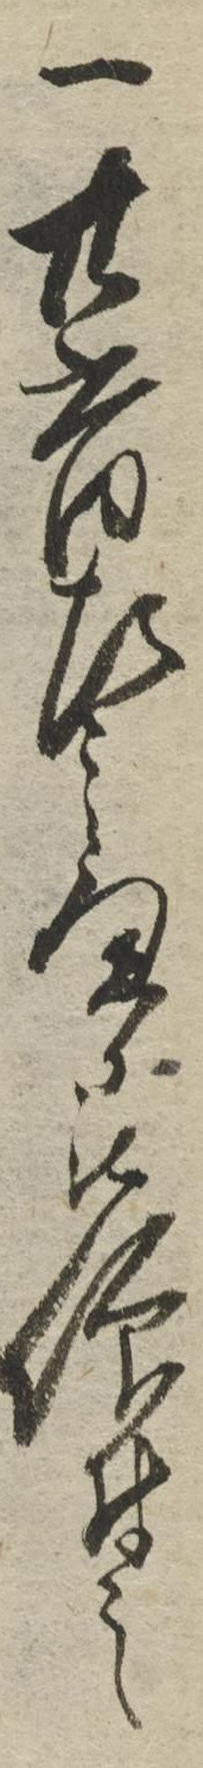一廿六日左之通に被仰付之
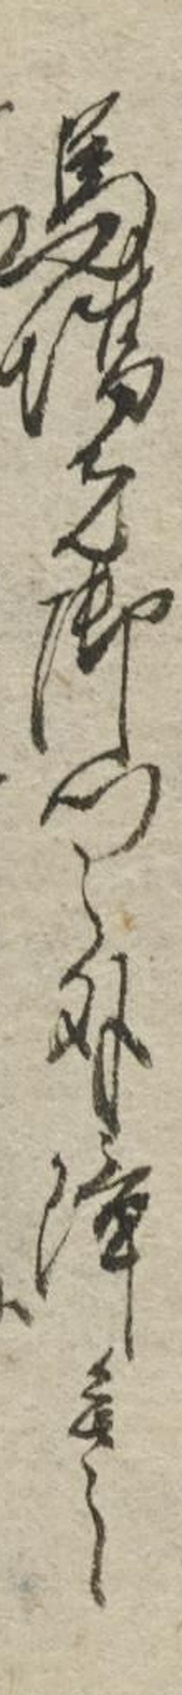馬場先御門之外障無之
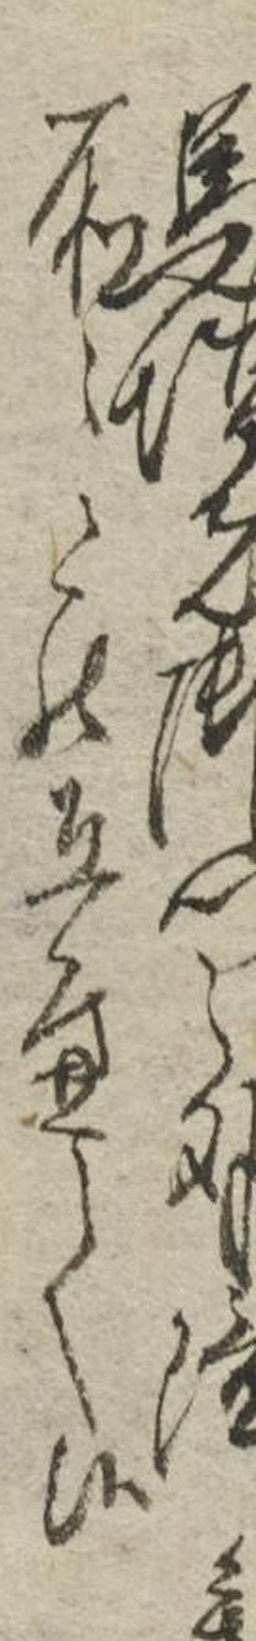所々二罷在へく候
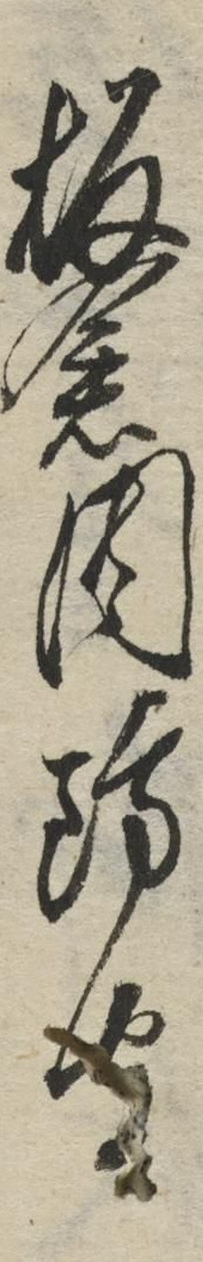板倉甲斐守
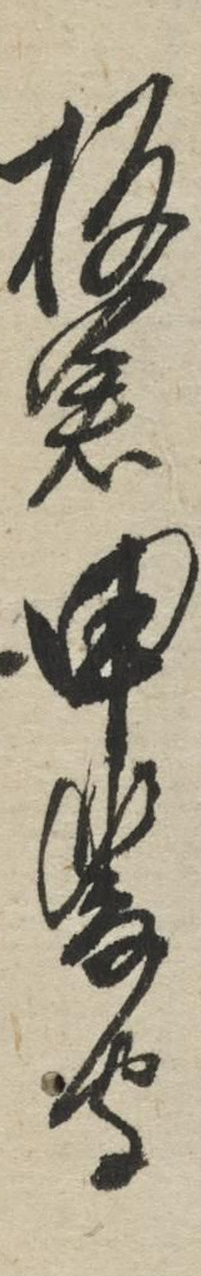板倉甲斐守
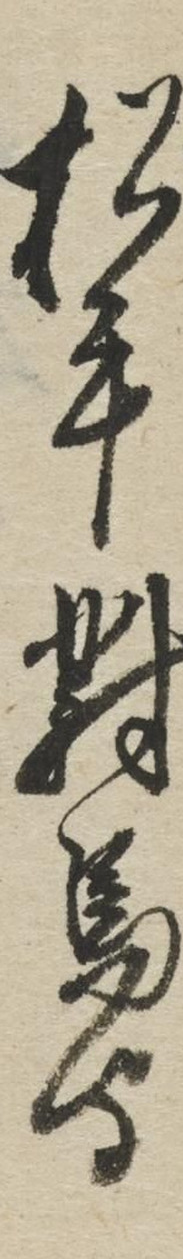松平対馬守
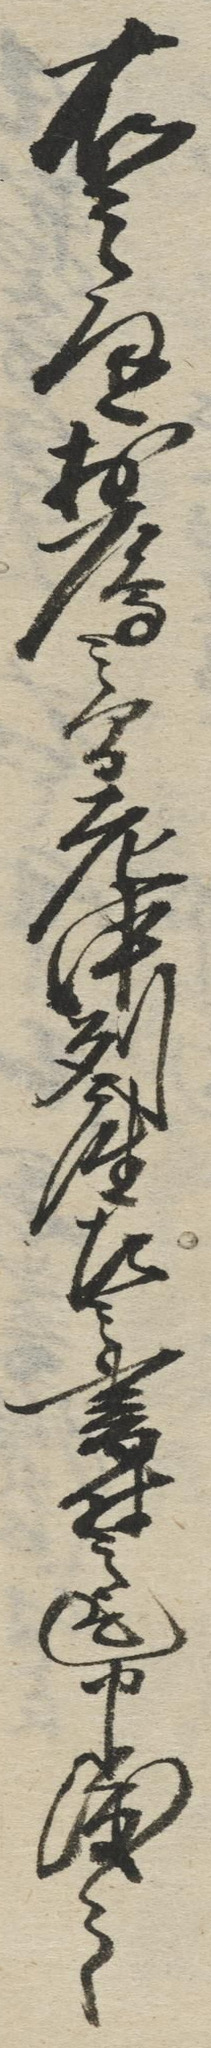右之通於鳫之間老中列座左之書付之趣申渡之
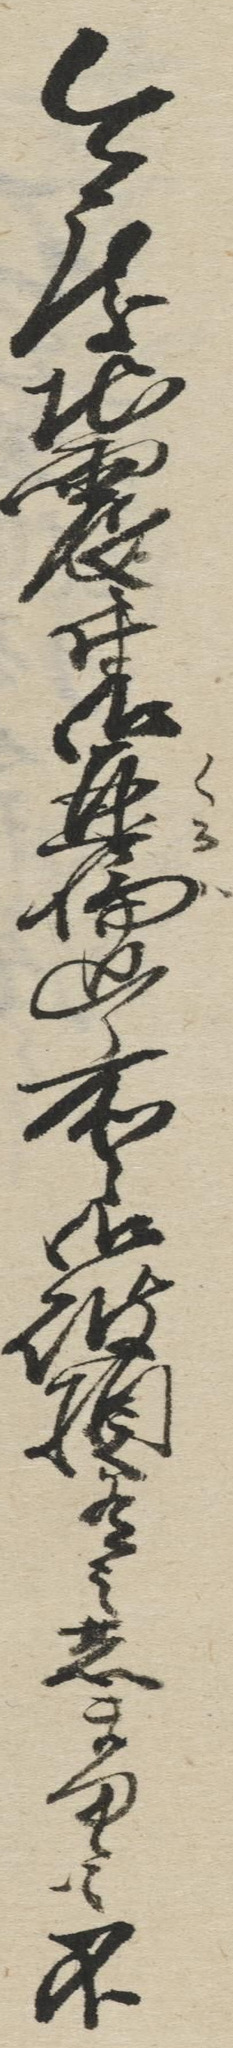今度地震二付御曲輪辺所々御破損有之しまりも不
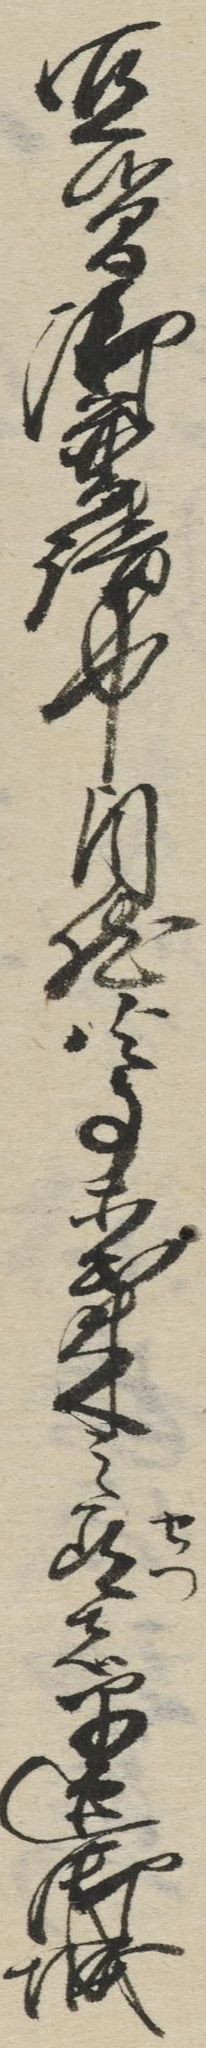宜候間御普請中自然火事相出来之節は早速御城
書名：元禄地震記
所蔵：東京大学地震研究所図書室 Earthquake Research Institute Library, The University of Tokyo, JAPAN
